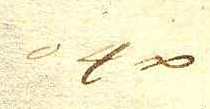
040
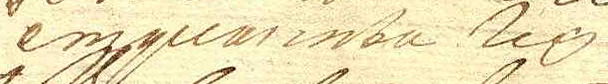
em quarenta Reis
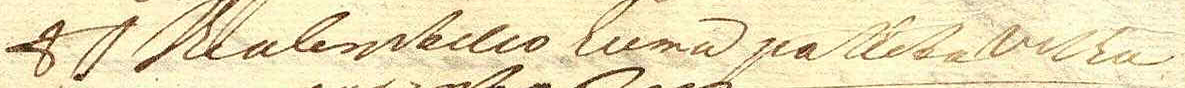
item lhe aComteCeo huma palheta velha
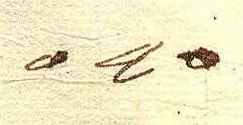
040
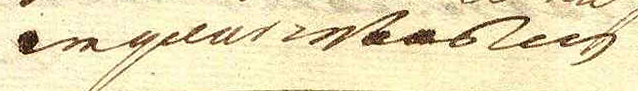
em quarenta Reis
